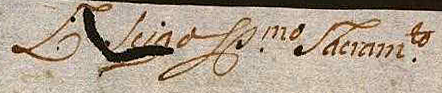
Lo Seja o SS.mo Sacram.to
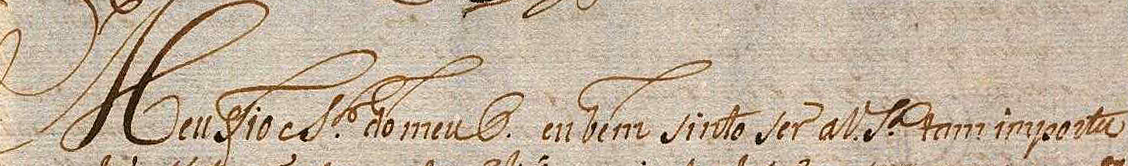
Meu Tio e S.or do meu C. eu bem sinto ser a V.S.a tam importu
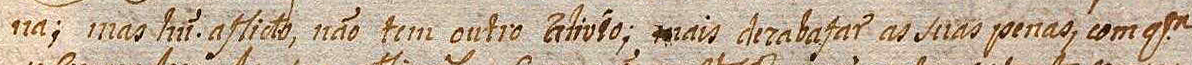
na; mas hū. aflicto, não tem outro ativso; mais dezabafar as suas penas, com q.m
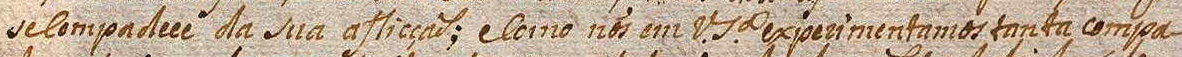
se Compadece da sua aflicçaõ, e Como nós em V S.a experimentamos tanta compa
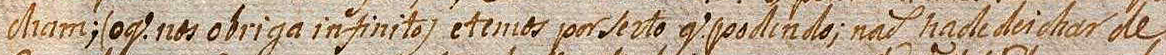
cham; (o q̄ nos obriga infinito) e temos por serto q̄ podendo; naõ ha de deichar de
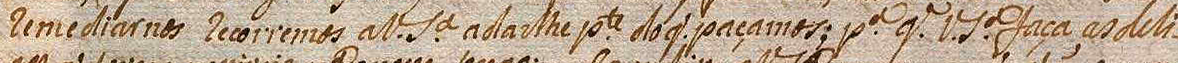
Remediarnos Recorremos a V. S.a a darlhe p.te do q̄ paçamos; p.a q.a V. S.a faça as deli
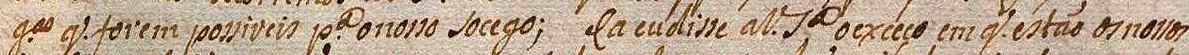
g.as q̄ forem possiveis p.a o nosso socego; e la eu disse a V. S.a o exceço em q̄ estaõ os nossos
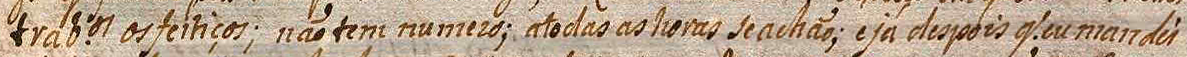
trab.os os feitiços; naõ tem numero; a todas as horas se achaõ; e ja despois q̄ eu mandei
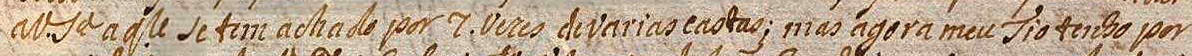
a V. S.a aq.le se tem achado por 7. vezes de varias castas; mas agora meu Tio tenho por
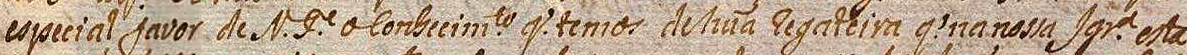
especial favor de N. P.e o Conhecim.to q̄ temos de hūa Regateira q̄ na nossa Jgr.a esta
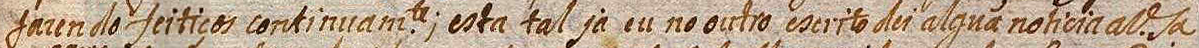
fazendo feitiços continuam.te; esta tal ja eu no outro escrito dei alguā noticia a V. sa
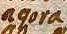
agora
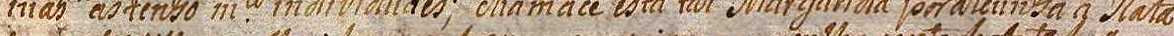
mas as tenho m.to individuaes; chamace esta tal Margarida por alcunha a Rata
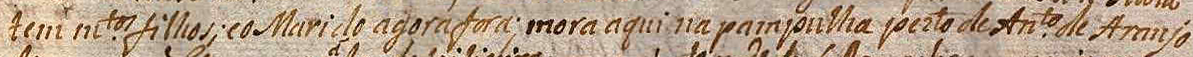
tem m.tos filhos; e o Marido agora fora; mora aqui na pampulha perto de Anto de Araujo
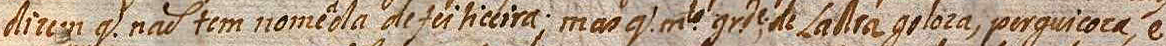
dizem q̄ naõ tem nomeada de feiticeira; mas q̄. m.to gr.de de Ladra goloza, perguicoza, e
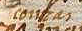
couzas
